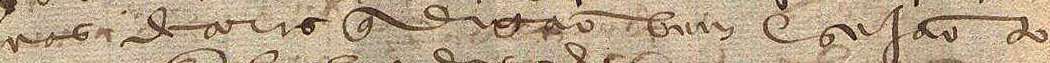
nas de cores q̄ digaõ bem e seJaõ to
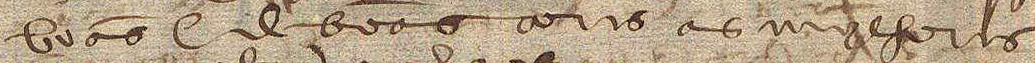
boāas e de boās cores as mylhores
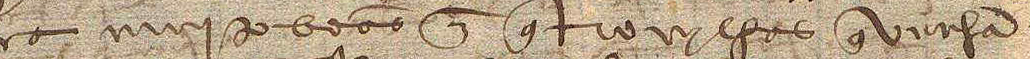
ca mujto boās item q̄tro cylhas q̄ venhā
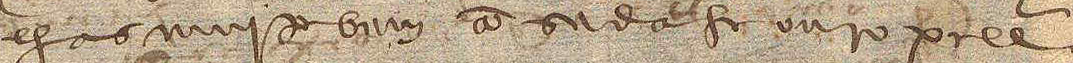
lhas mujto bem c̄o seda he ouropell
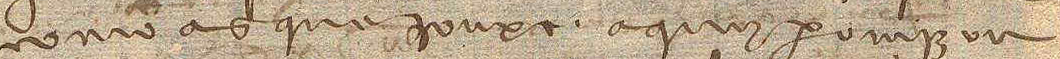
como as que trouxe. aquy ꝑo mjz ou
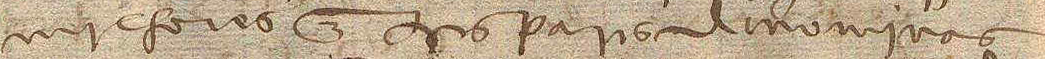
mjlhores item tres pares de nomjnas
